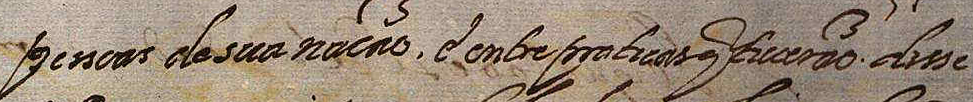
pessoas de sua naçaõ, e entre praticas q̄ tiuerão. disse
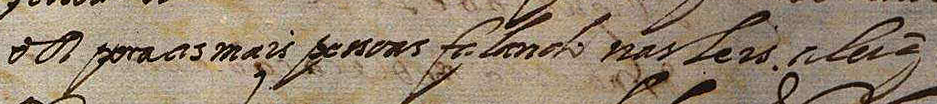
o R pera as mais pessoas falando nas Leis. a lei q̄
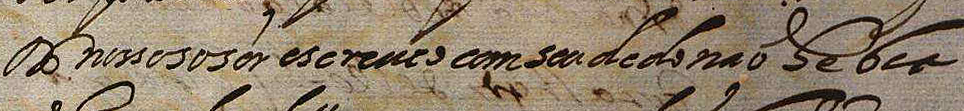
Ds̄ nosso so sōr escreueo com seu dedo naõ he boa
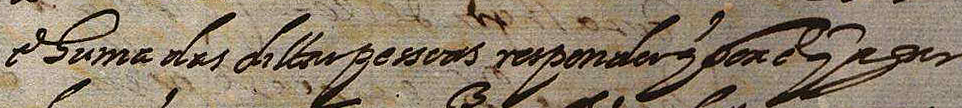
e huma das dittas pessoas respondeo q̄ boa e q̄ a gar
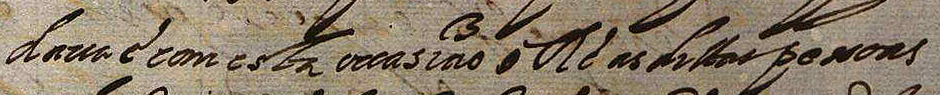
daua ē com esta occasiaõ o R e as dittas pessoas
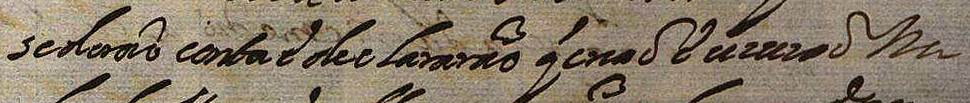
se deraõ conta e declararaõ q̄ criaõ e uiuiaõ na
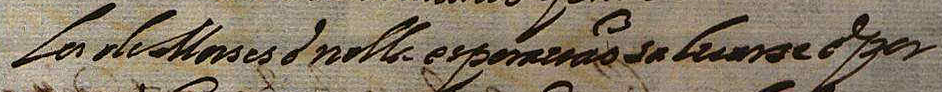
Lei de Moises e nella esperauaõ saluarse e por
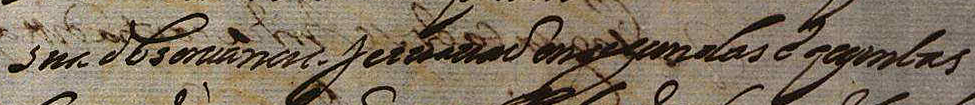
sua obseruancia. jeiuauaõ en segundas e quintas
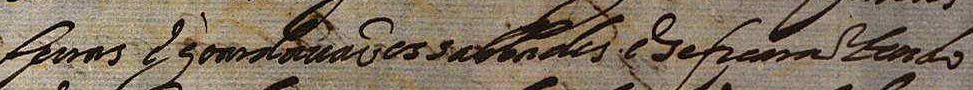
feiras e goardauaõ os sabbados e se ficaraõ tendo
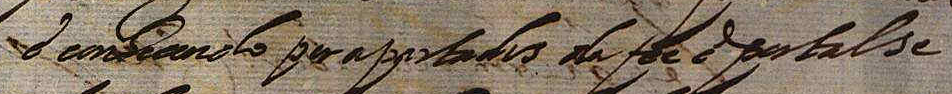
e conhecendo por apartados da fee e por tal se
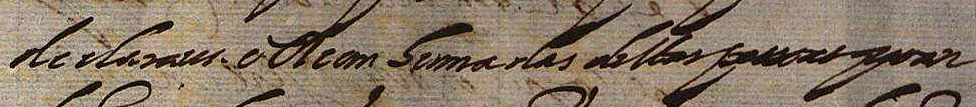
declaraua o R com huma das dittas pessoas quoan
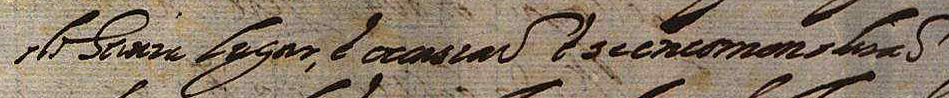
do hauia lugar, e occasiaõ e se encomendaraõ
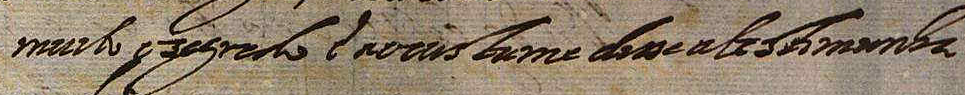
muito o segredo e ao custume disse a testemunha
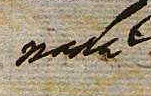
nada
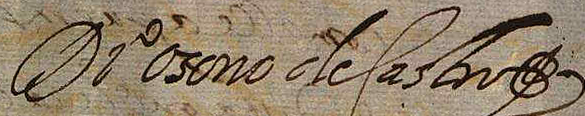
Dio osorio de Castro
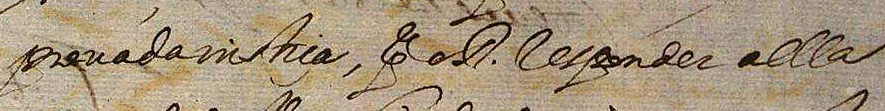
proua da iustiça, pa o R. Responder a ella
